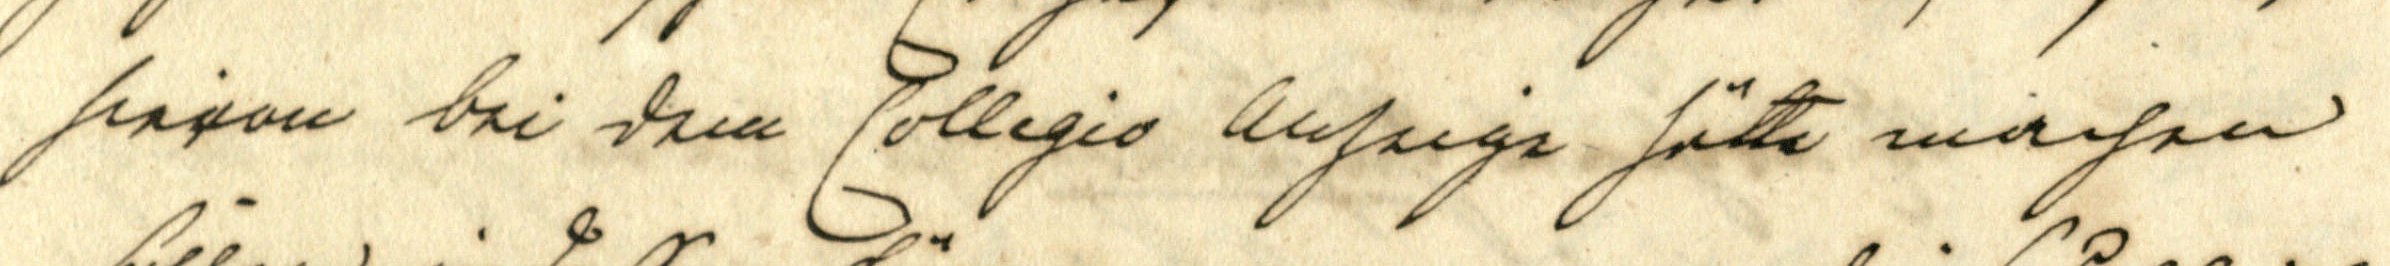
hievon bei dem Collegio Anzeige hätte machen
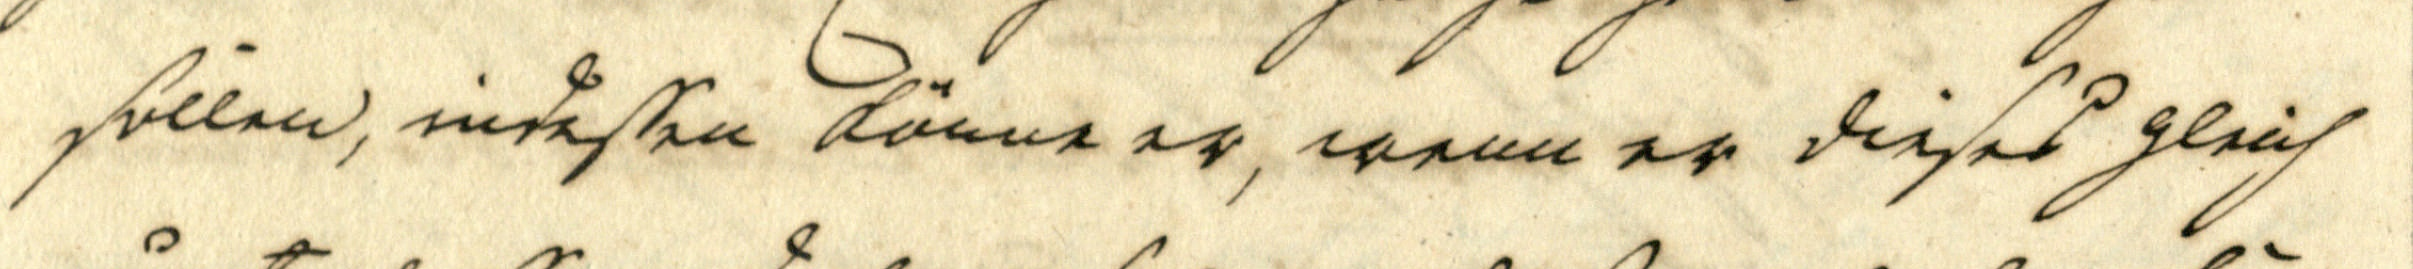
sollen, indessen könne er, wenn er dieses gleich
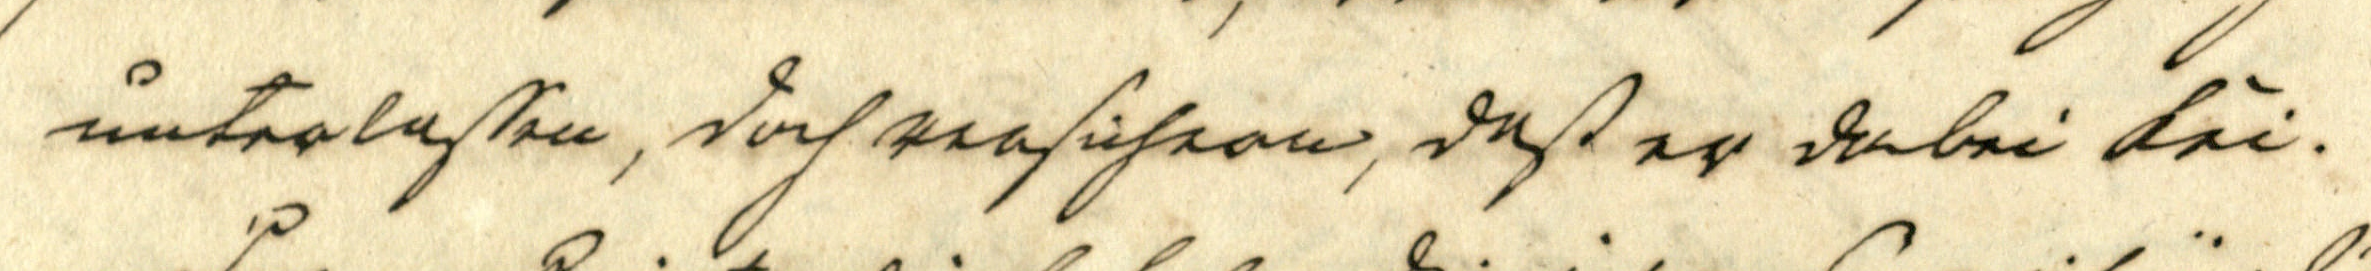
unterlassen, doch versichern, daß er dabei kei¬
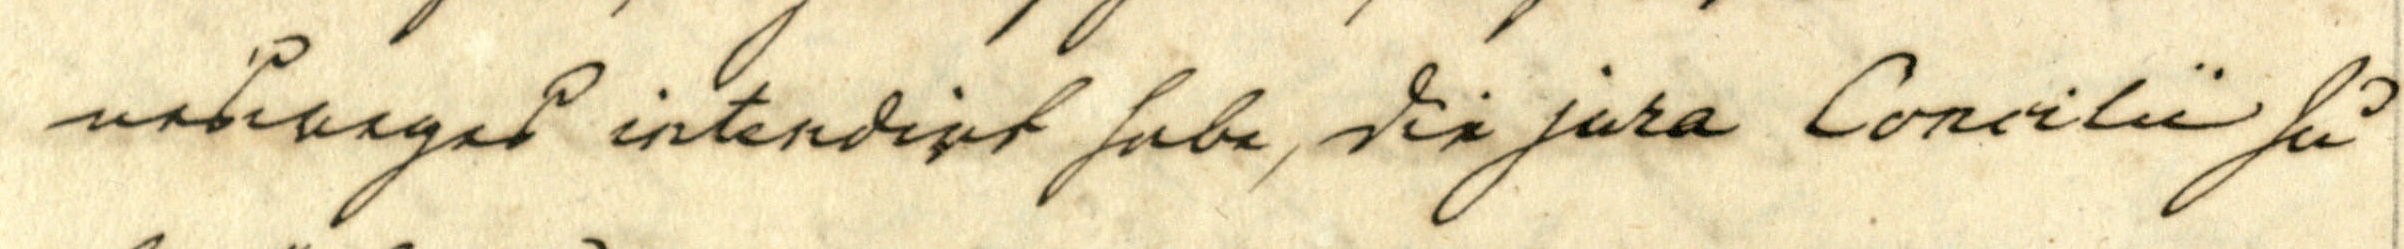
nesweges intendirt habe, die jura Concilii zu
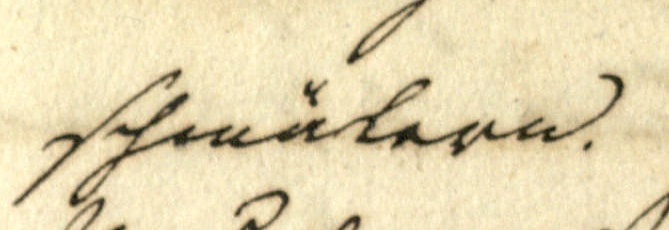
schmälern.
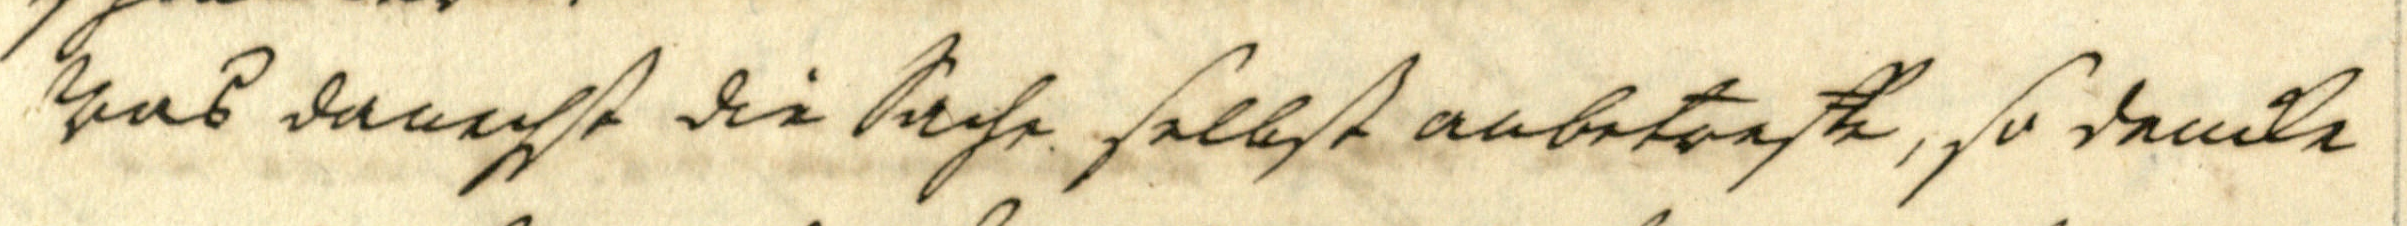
Was danechst die Sache selbst anbetreffe, so dencke
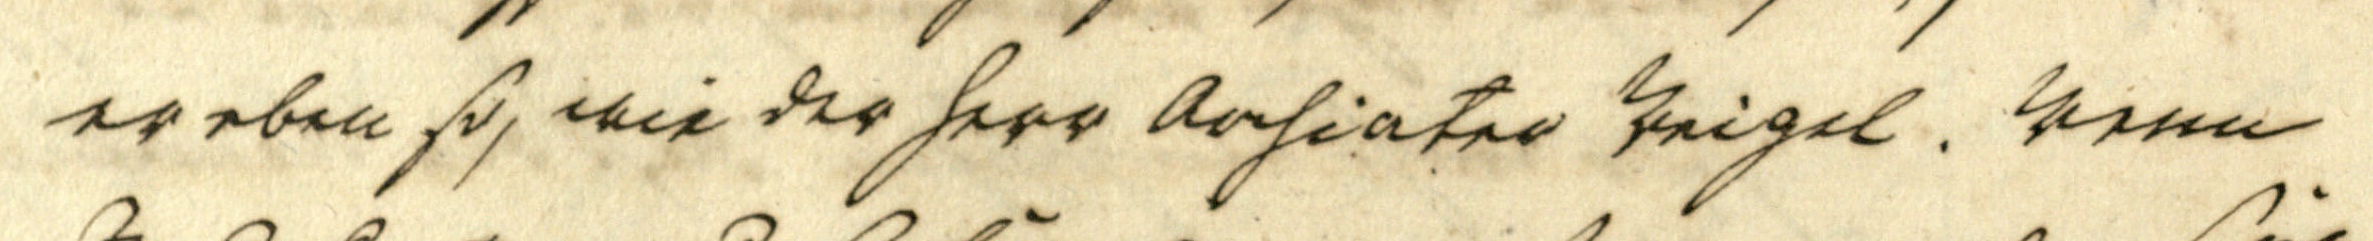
er eben so, wie der Herr Archiater Weigel. Wenn
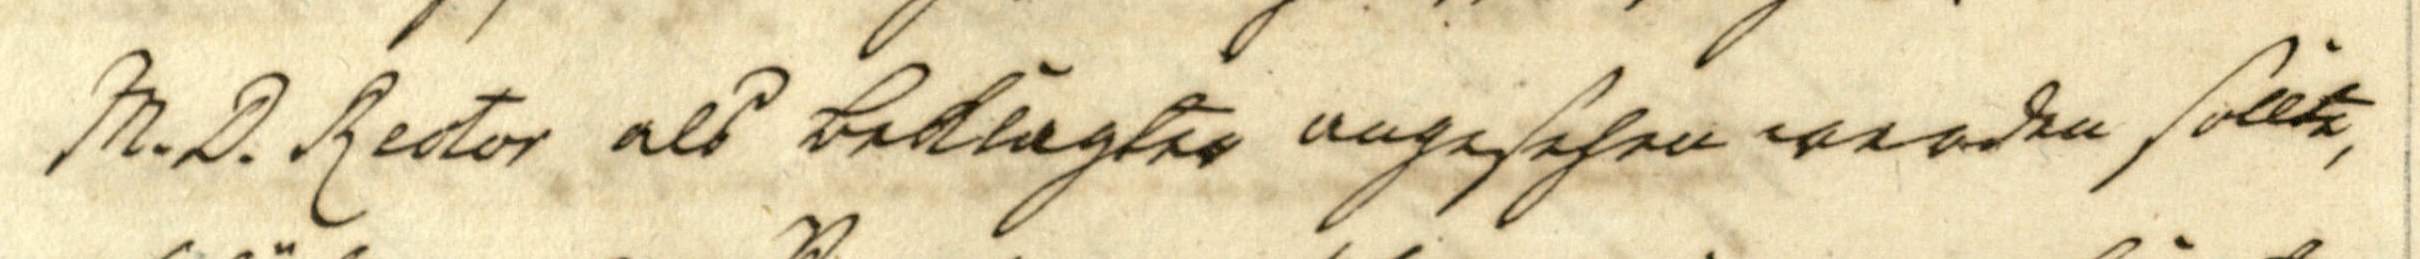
M. D. Rector als Beklagter angesehen werden sollte,
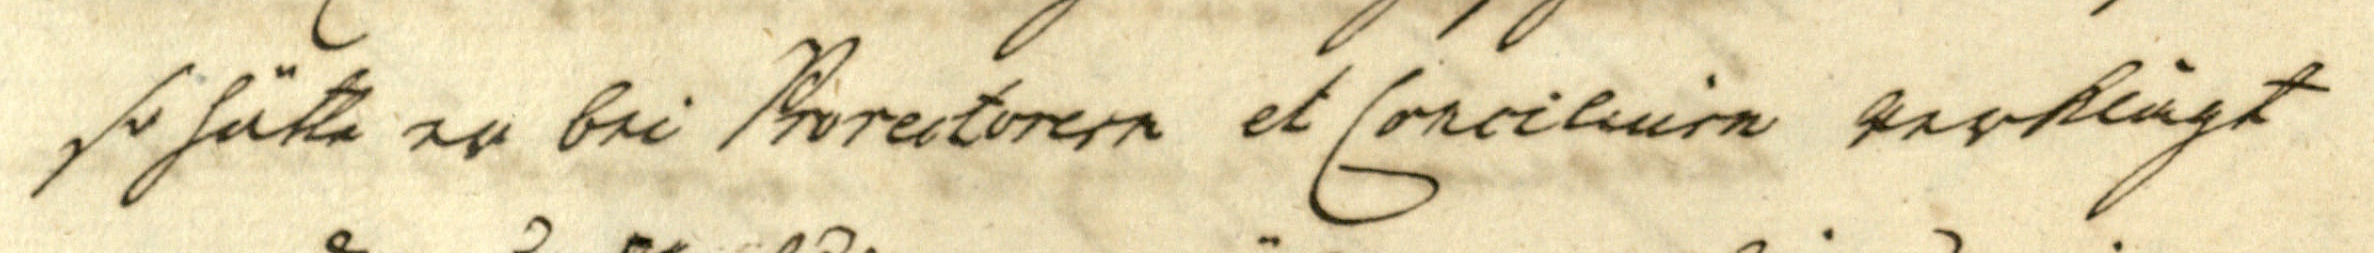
so hätte er bei Prorectorem et Concilium verklagt
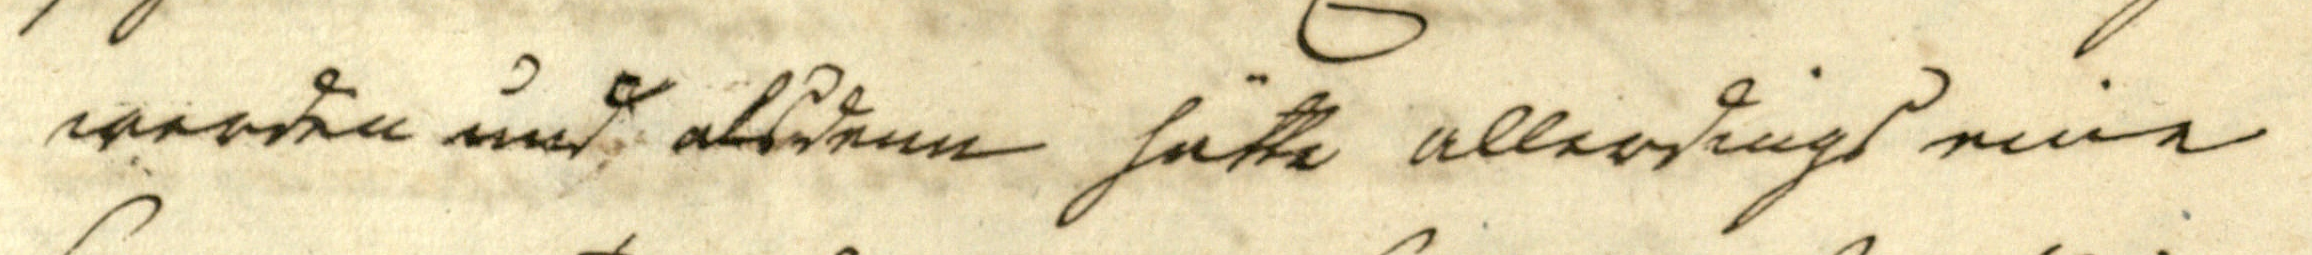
werden und alsdenn hätte allerdings eine
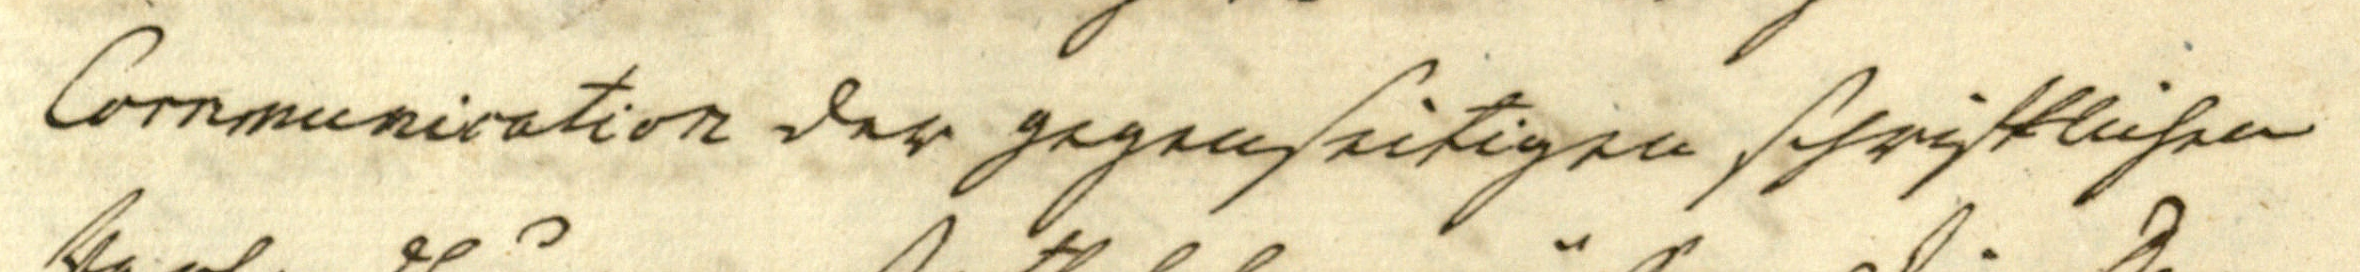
Communication der gegenseitigen schriftlichen
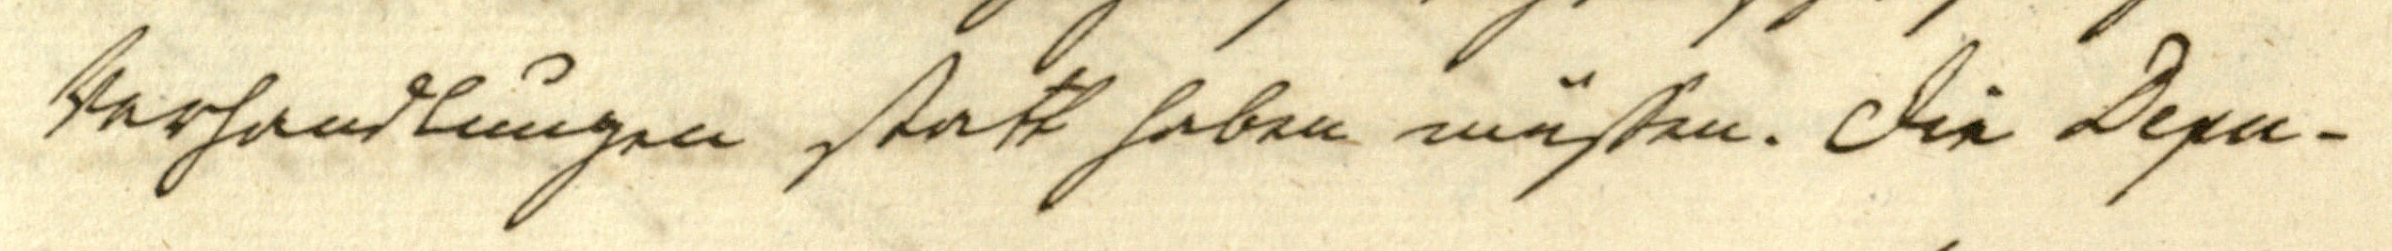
Verhandlungen statt haben müssen. Die Depu¬
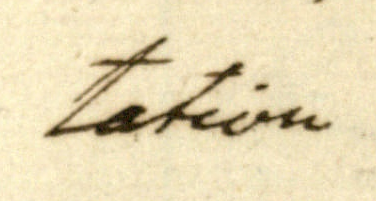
tation
